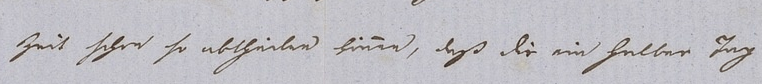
Zeit schon so abtheilen können, daß Dir ein halber Tag
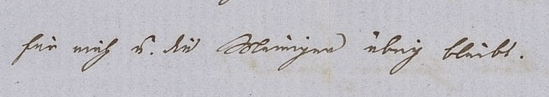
für mich u. die Meinigen übrig bleibt.
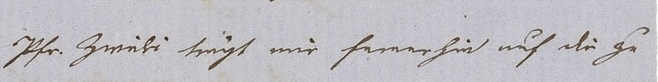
Pfr. Zwicki trägt mir fernerhin auf Dir zu
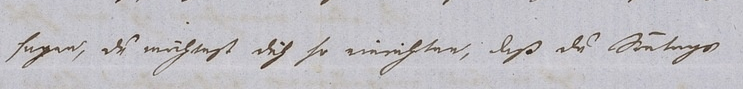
sagen, Du möchtest Dich so einrichten, daß Du Sonntags
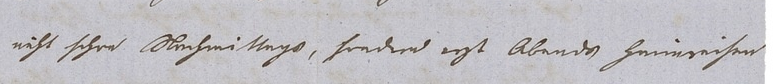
nicht schon Nachmittags, sondern erst Abends heimreisen
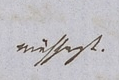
müssest.
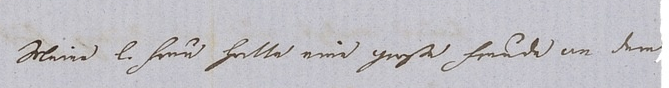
Meine l. Frau hatte eine große Freude an dem,
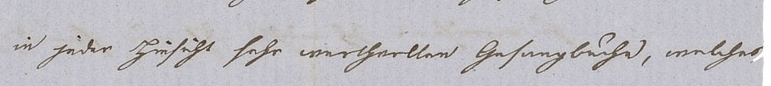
in jeder Hinsicht sehr werthvollen Gesangbuche, welches
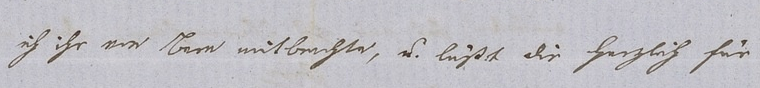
ich ihr von Bern mitbrachte, u. läßt Dir herzlich für
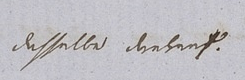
dasselbe danken.
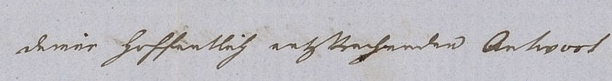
Deiner hoffentlich entsprechenden Antwort
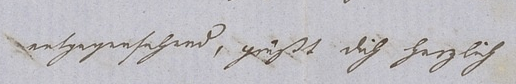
entgegensehend, grüßt Dich herzlich
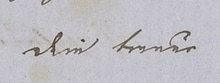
Dein treuer
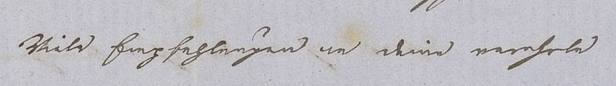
Viele Empfehlungen an Deine verehrte
